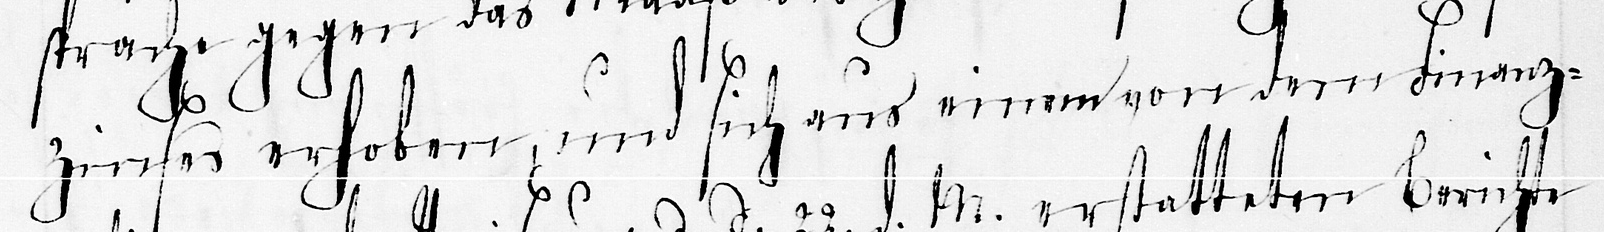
zinses erhoben, und sich aus einem von dem Finanz¬
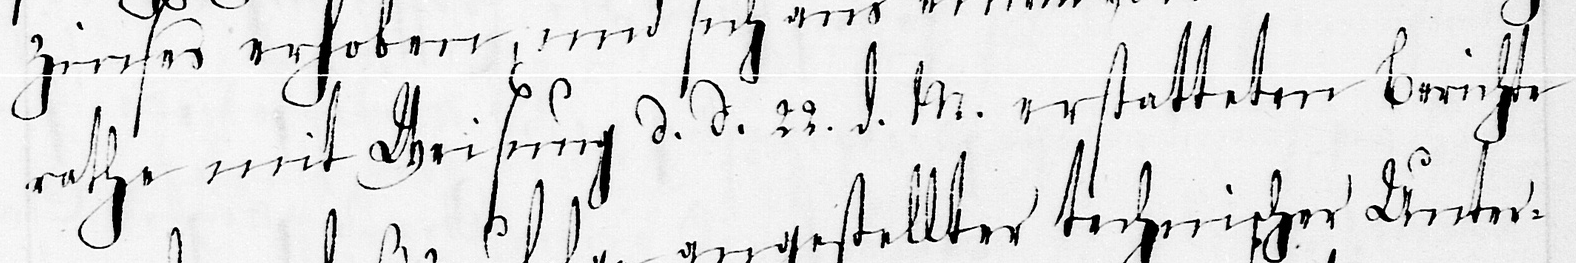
rathe mit Weisung d. d. 22. d. M. erstatteten Berichte
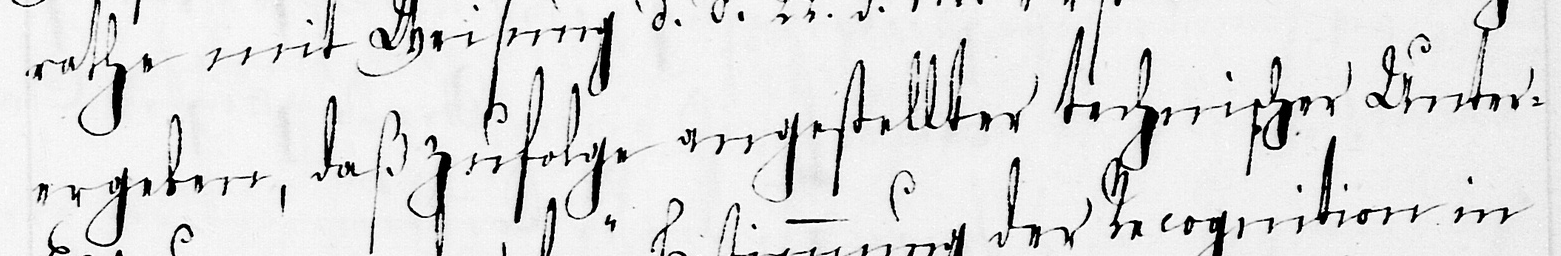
ergeben, daß zufolge angestellter technischer Unter¬
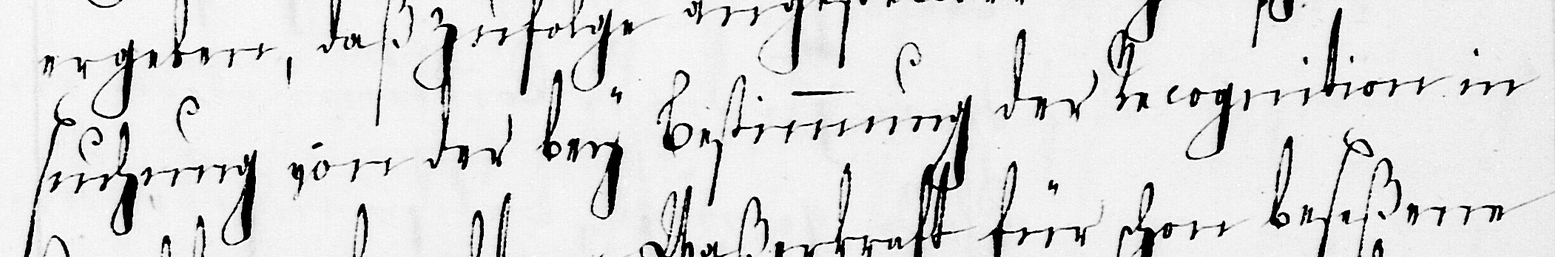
suchung von der bey Bestimmung der Recognition in
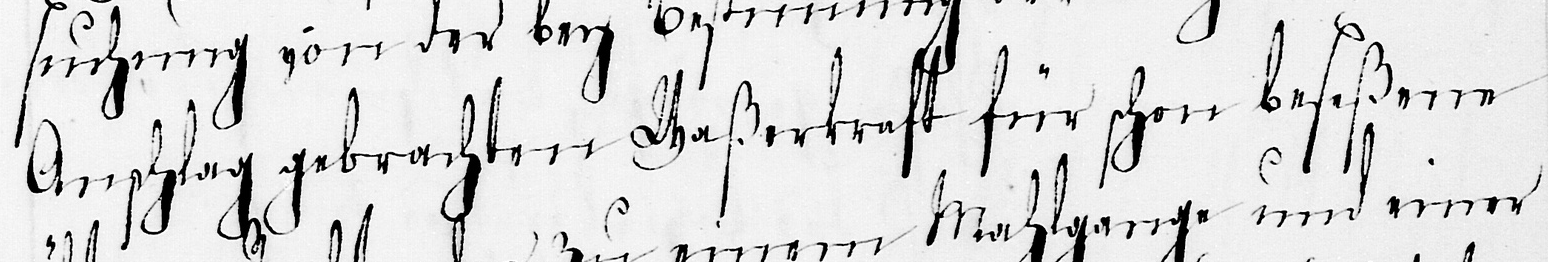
Anschlag gebrachten Waßerkraft für schon beseßene
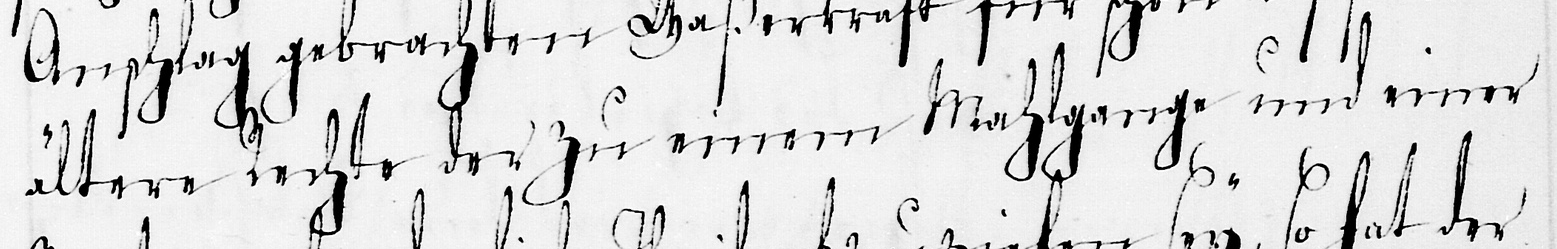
ältere Rechte der zu einem Mahlgange und einer
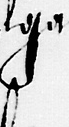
41.
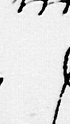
8.
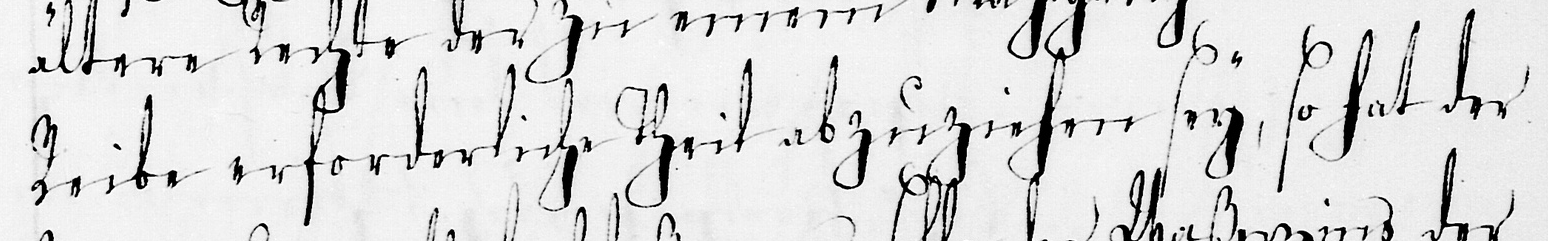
Reibe erforderliche Theil abzuziehen sey, so hat der
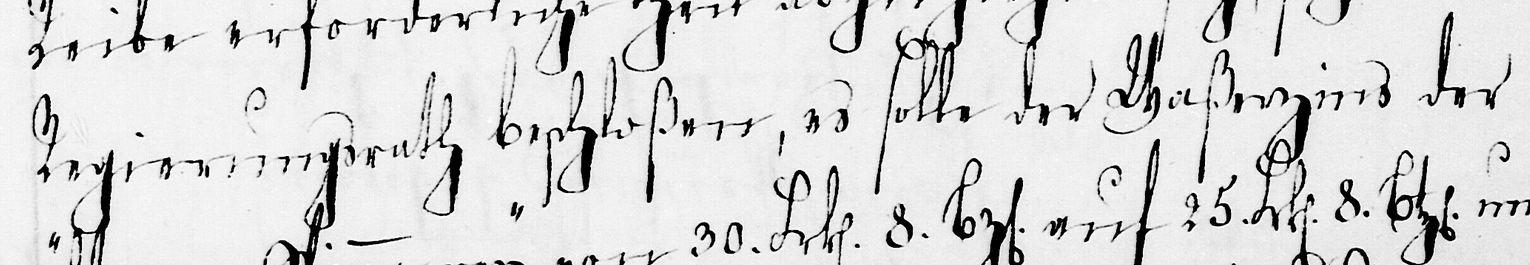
Regierungsrath beschloßen, es solle der Waßerzins der
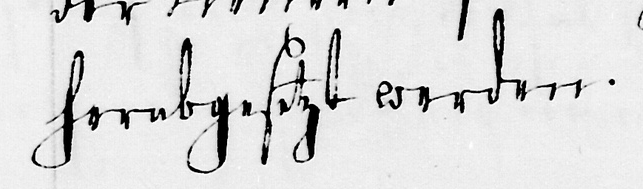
herabgesetzt werden.
